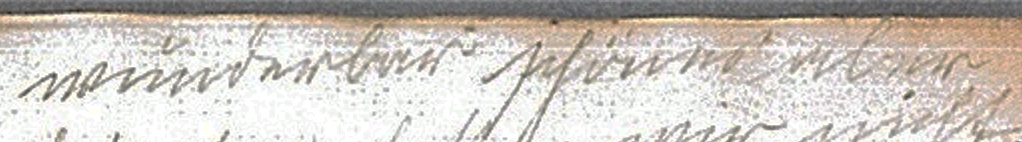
wunderbar schönes aber
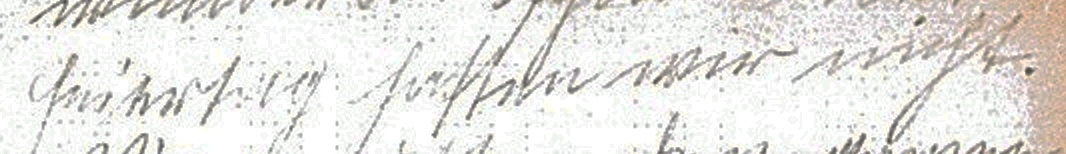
Feiertag hatten wir nicht.
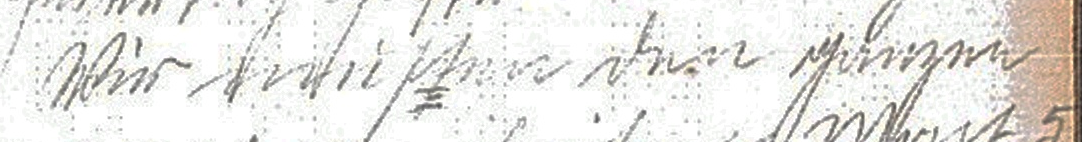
Wir musten den ganzen
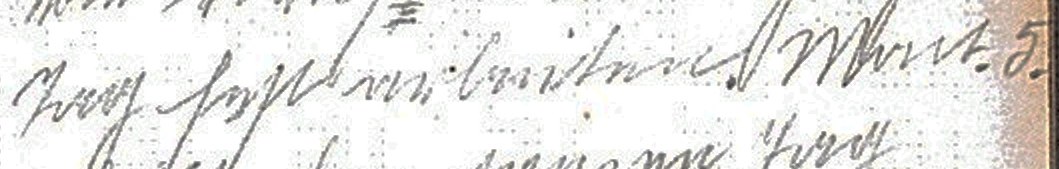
Tag fest arbeiten. Mont 5.
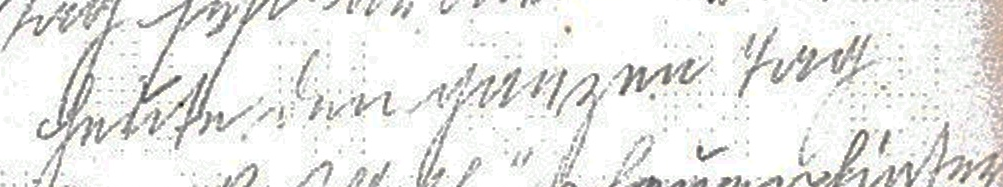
Heute den ganten Tag
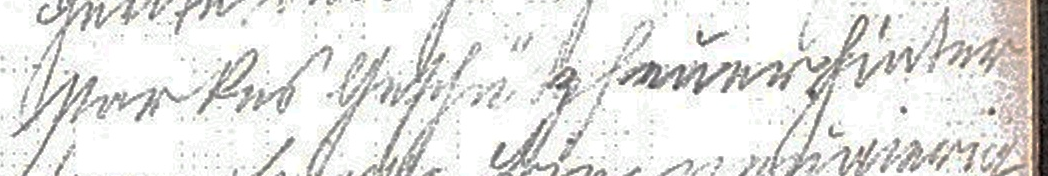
starkes Geschützfeuer hinter
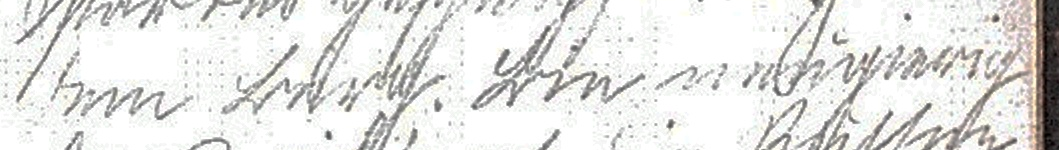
dem Berg. Bin neugierig
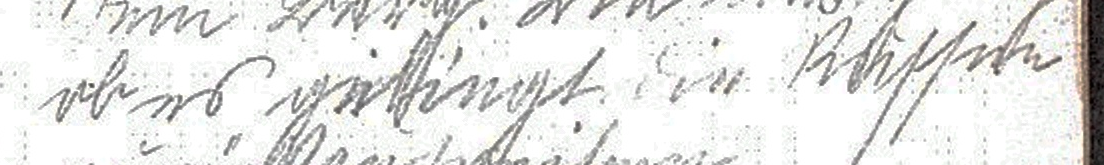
ob es gelingt. die Russen
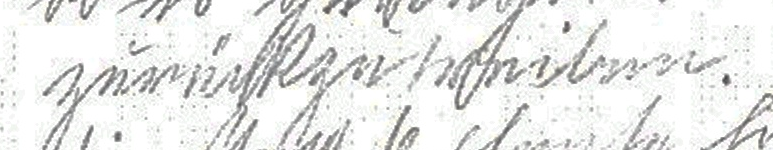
zurückzutreiben.
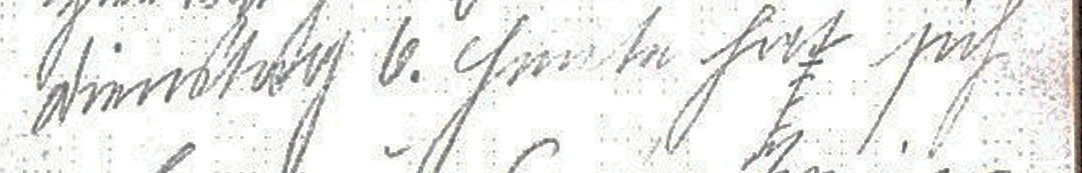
Dienstag 6. Heute hat sich
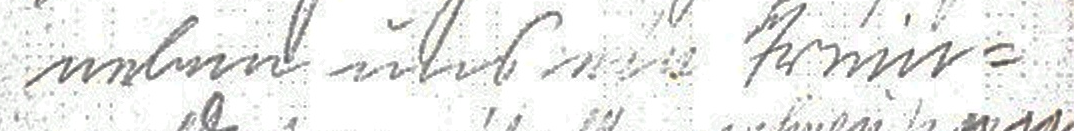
neben uns ein Trein-
